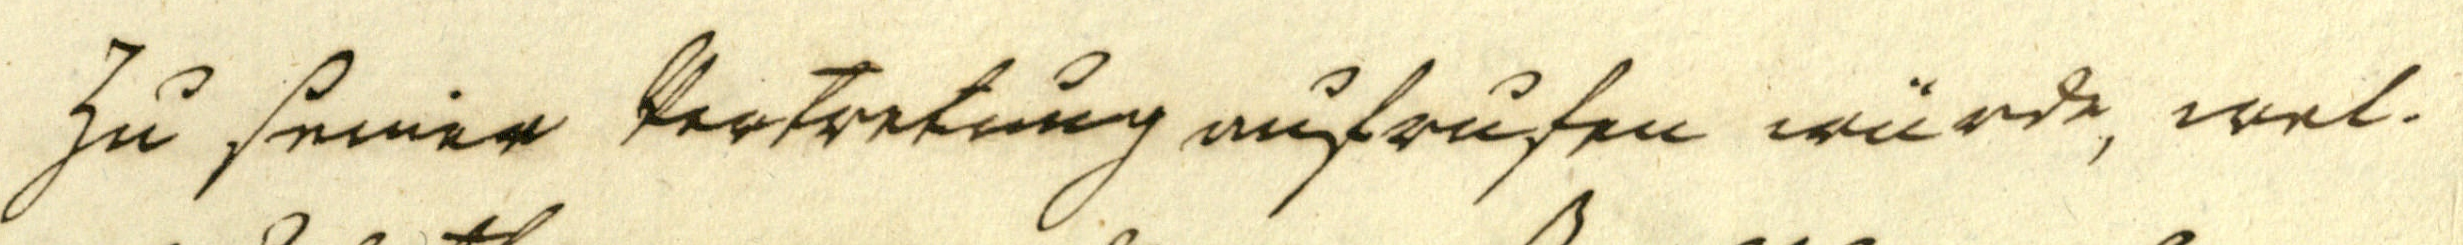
zu seiner Vertretung aufrufen würde, wel¬
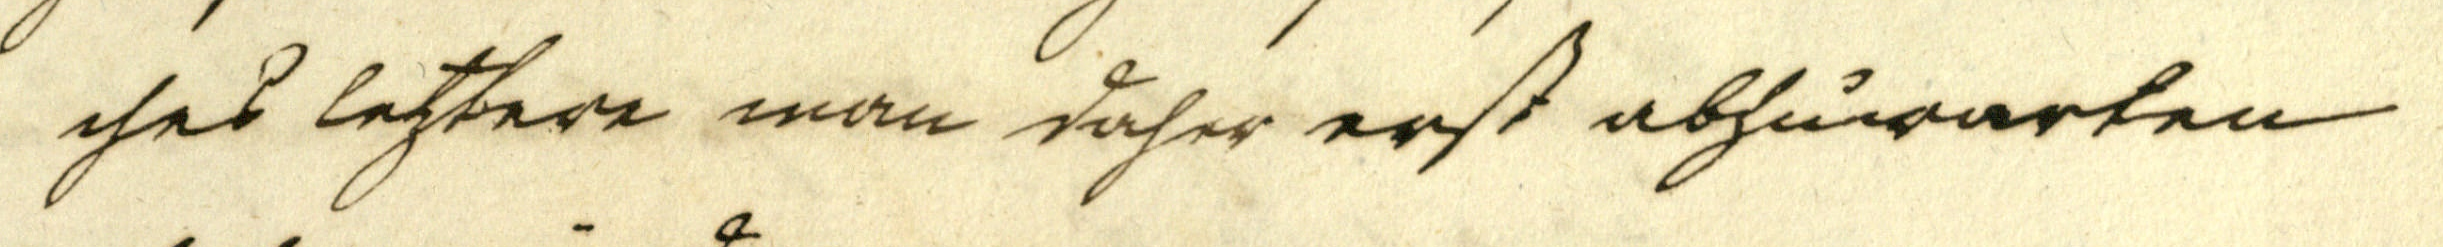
ches letztere man daher erst abzuwarten
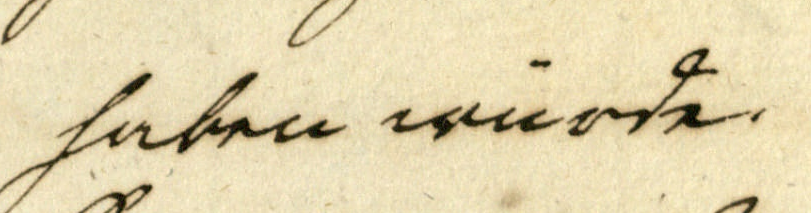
haben würde.
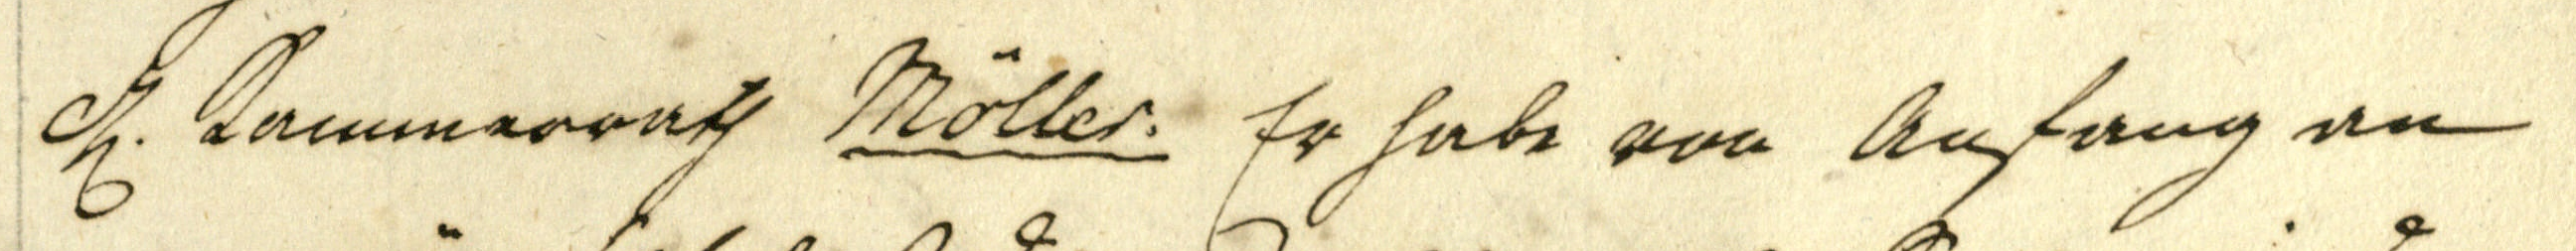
dh. Kammerrath Möller. Er habe von Anfang an
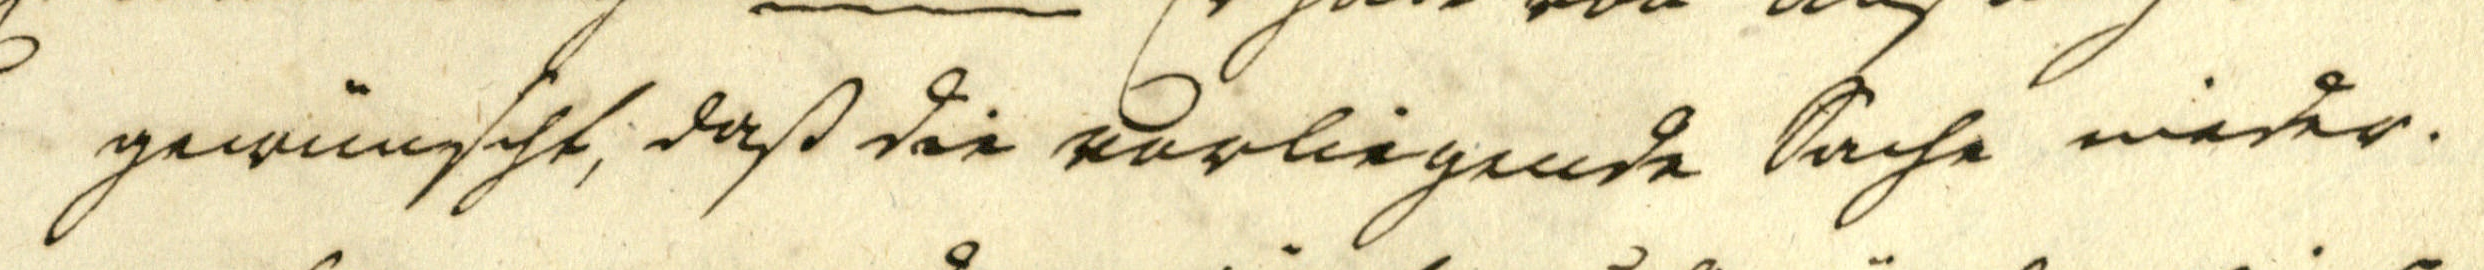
gewünscht, daß die vorliegende Sache nieder¬
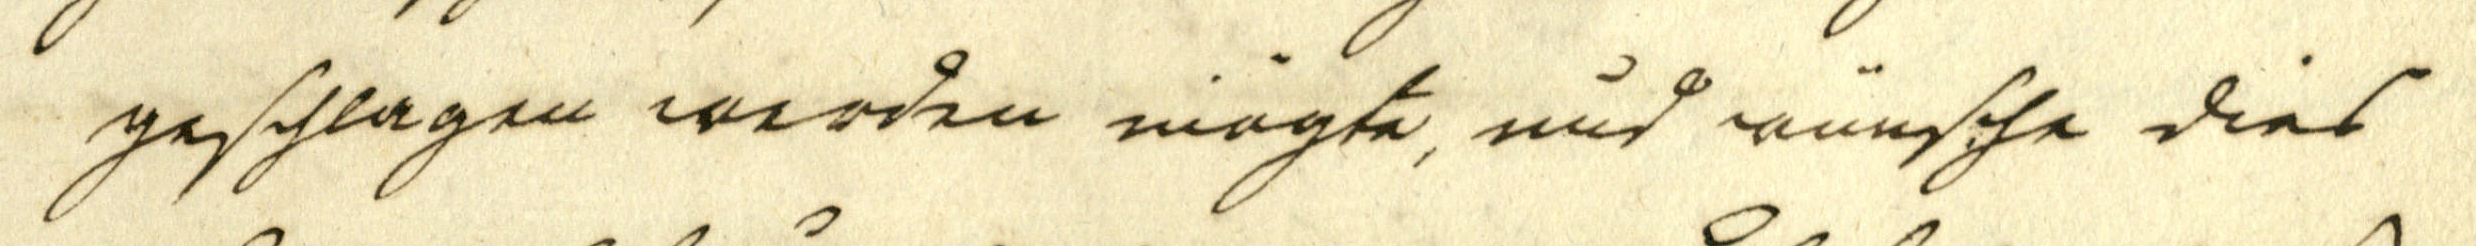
geschlagen werden mögte, und wünsche dies
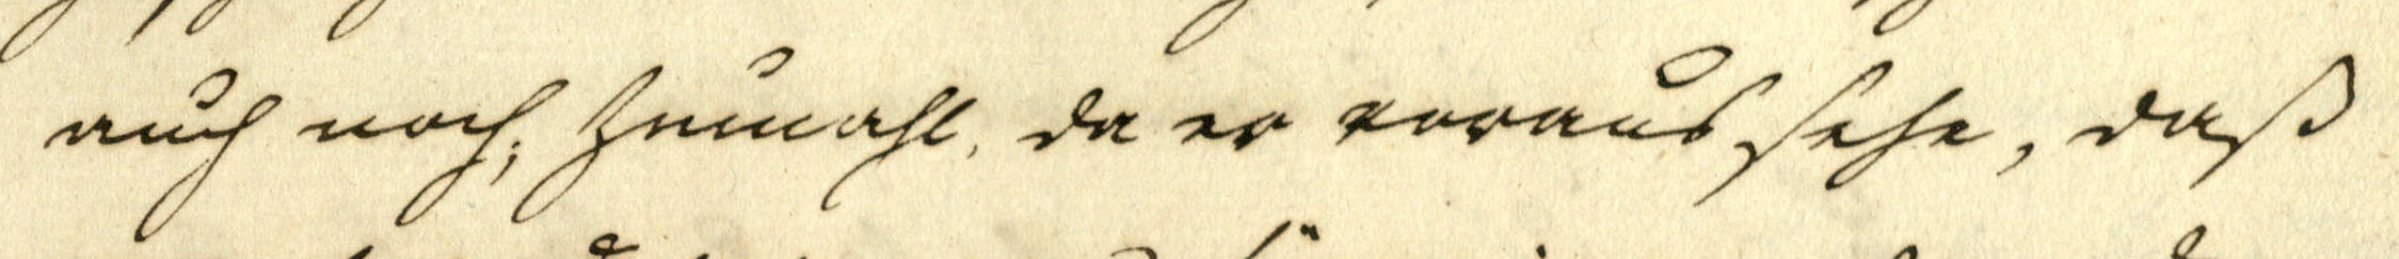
auch noch, zumahl, da er voraus sehe, daß
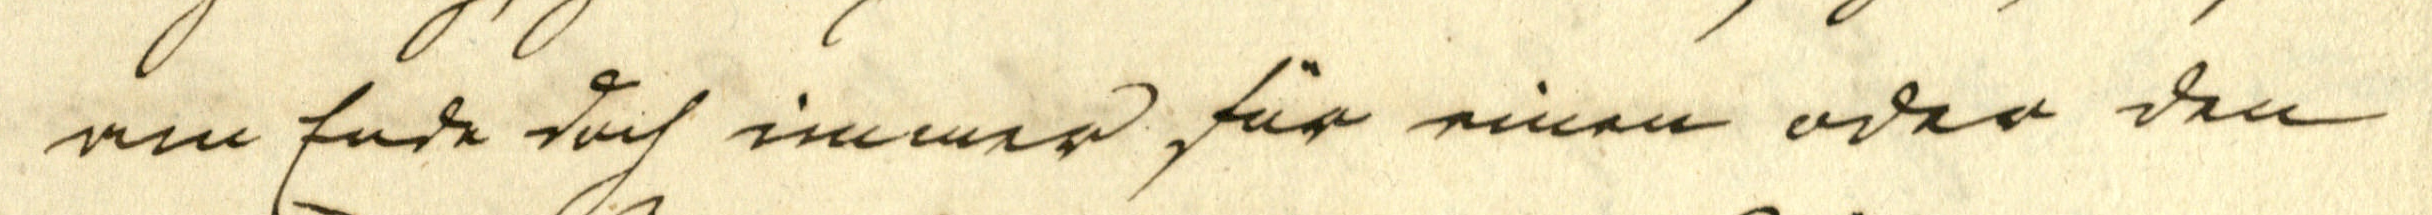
am Ende doch immer für einen oder den
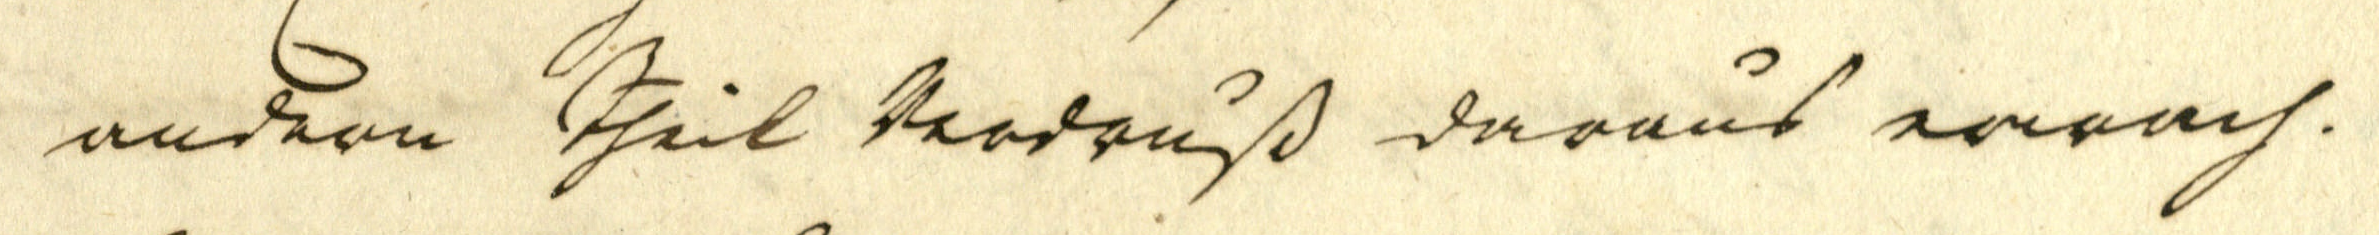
andern Theil Verdruß daraus erwach¬
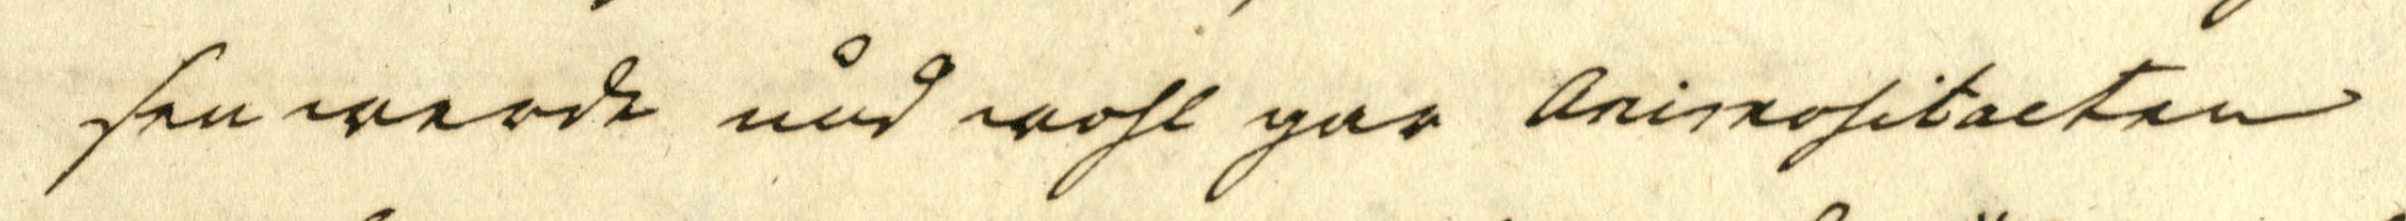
sen werde und wohl gar Animositaeten
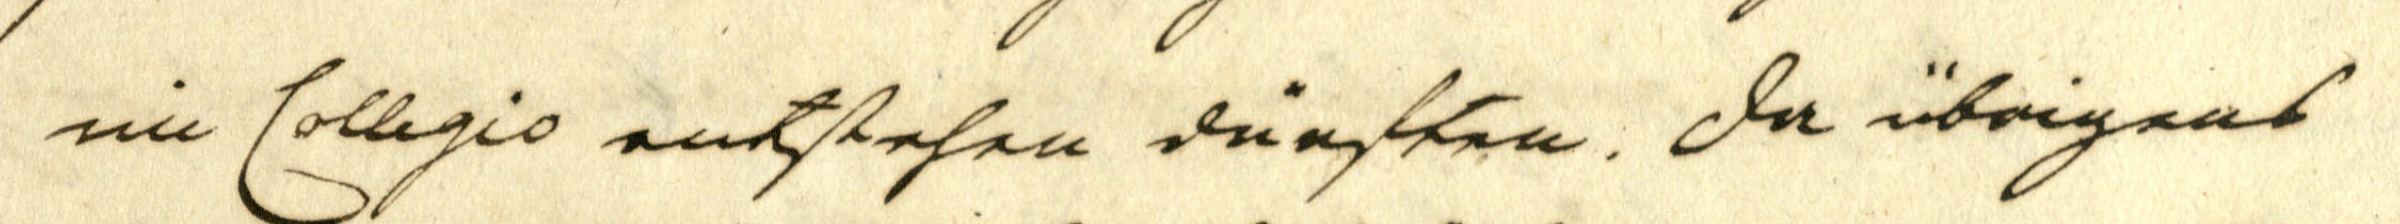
im Collegio entstehen dürften Da übrigens
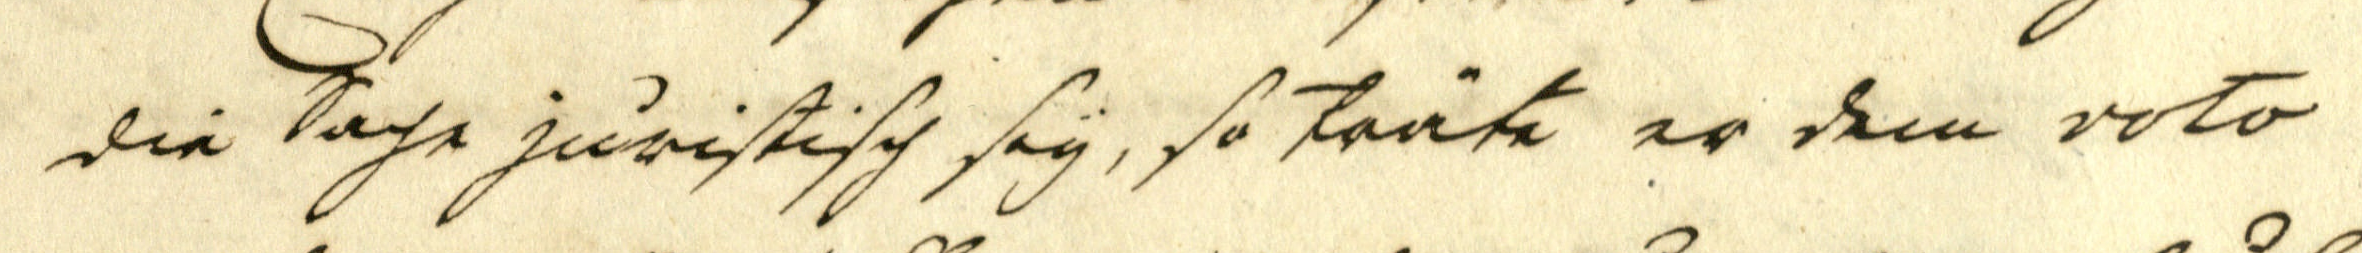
die Sache juristisch seÿ, so träte er dem voto
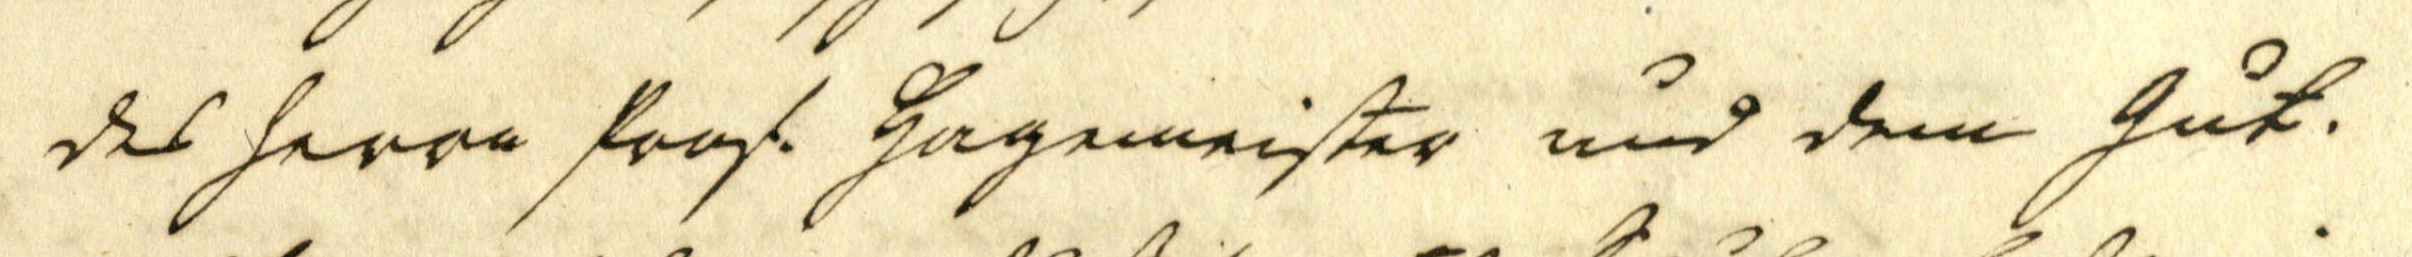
des Herrn Prof. Hagemeister und dem Gut¬
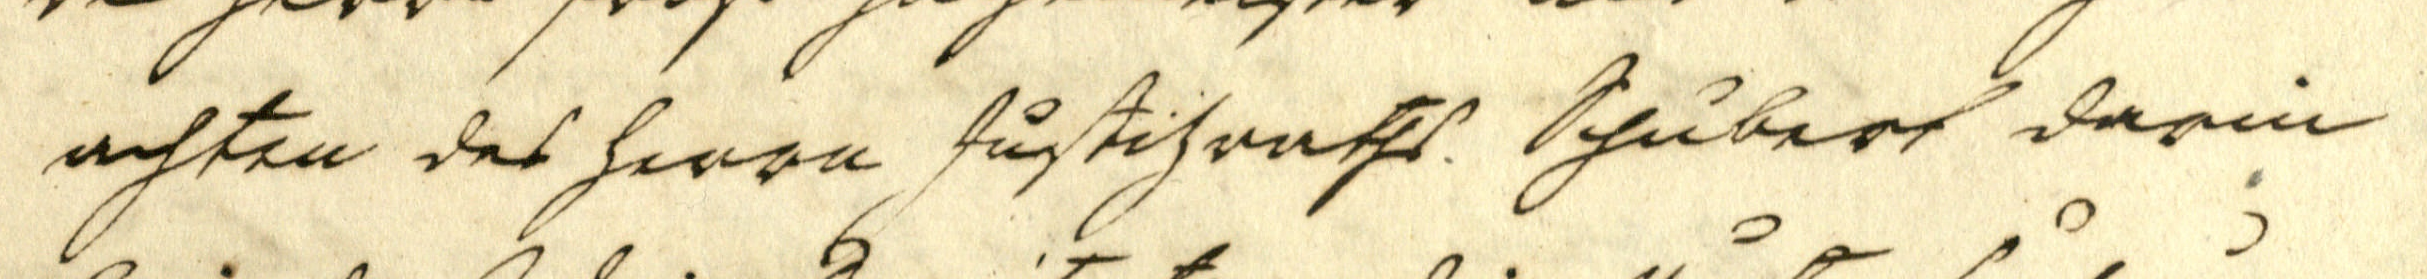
achten des Herrn Justizraths Schubert darin
